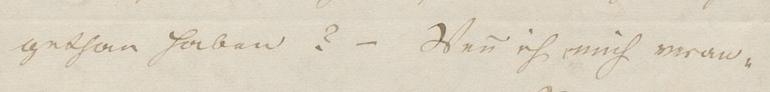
gethan haben? – Wenn ich mich veran-
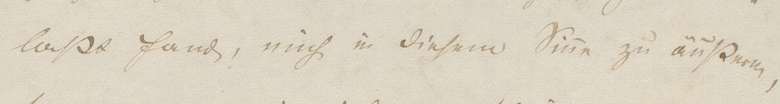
laßt fand, mich in diesem Sinne zu äußern,
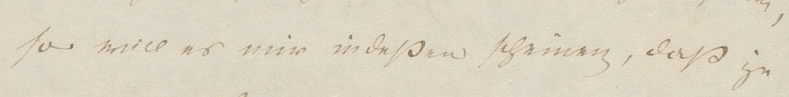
so will es mir indeßen schienen, daß je
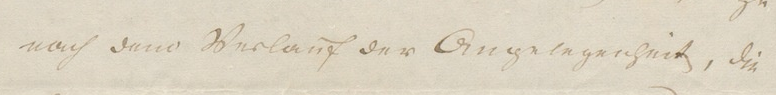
nach dem Verlauf der Angelegenheit, die
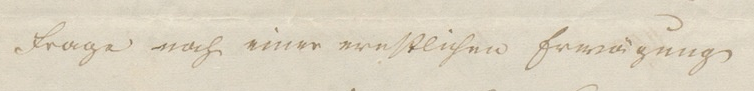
Frage nach einer ernstlichen Erwägung
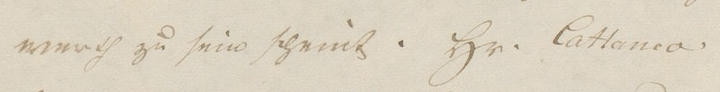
werth zu sein scheint. Hr. Cattaneo
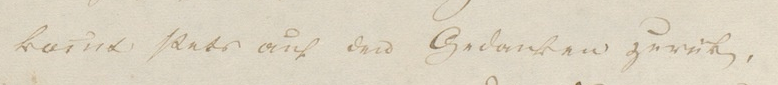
kommt stets auf den Gedanken zurück,
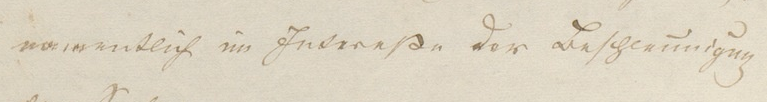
namentlich im Intereße der Beschleunigung
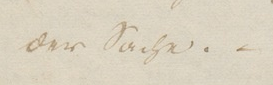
der Sache.
